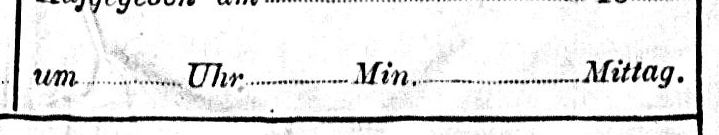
um .... Uhr .... Min......Mittag.
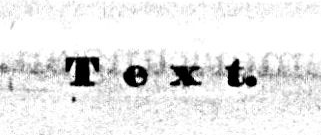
Text.
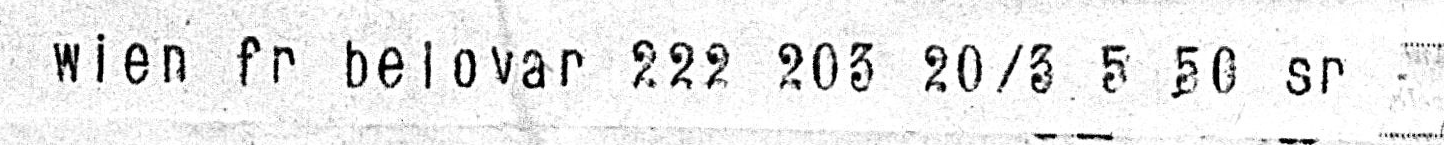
wienfr belovar 222 203 20/3 5 50 sr.
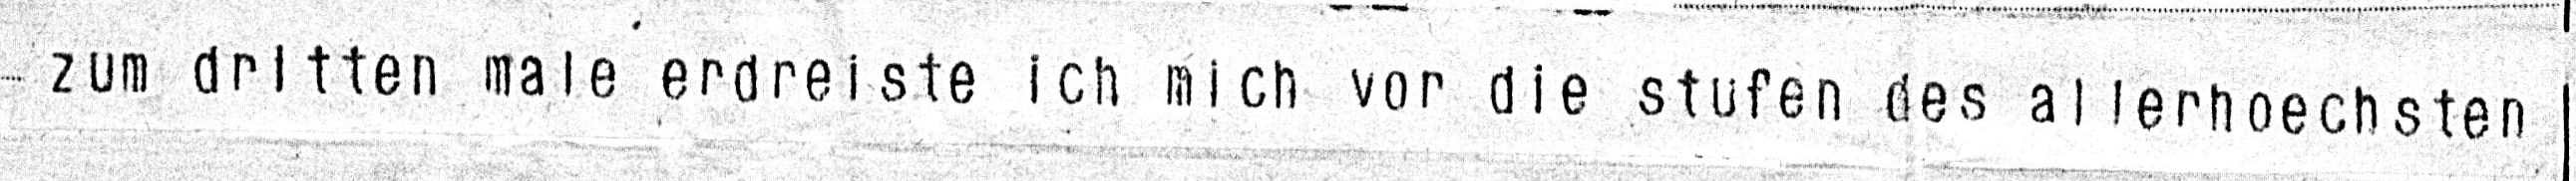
zum dritten male erdreiste ich mich vor die stufen des allerhoechsten
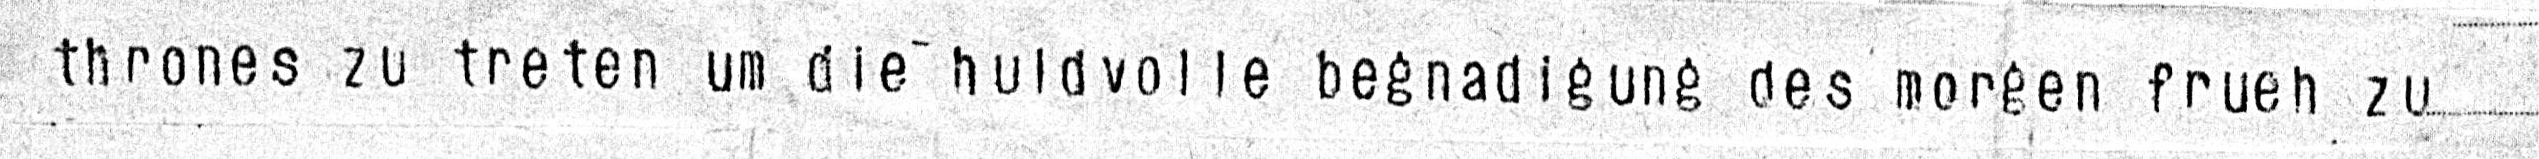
thrones zu treten um die huldvolle begnadigung des morgen frueh zu
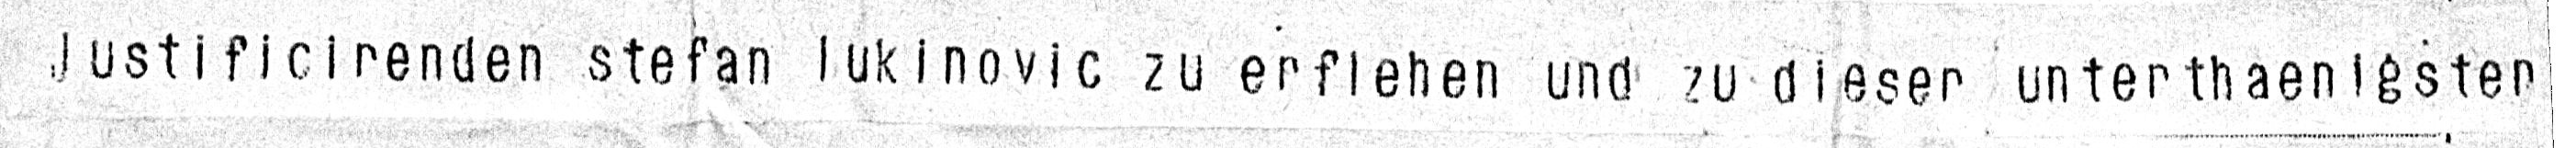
Justificirenden stefan lukinovic zu erflehen und zu dieser unterthaenigsten
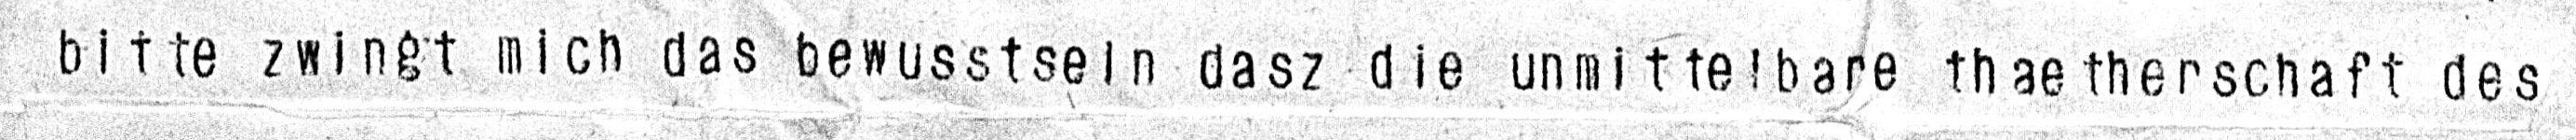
bitte zwingt mich das bewusstsein dasz die unmittelbare thaetherschaft des
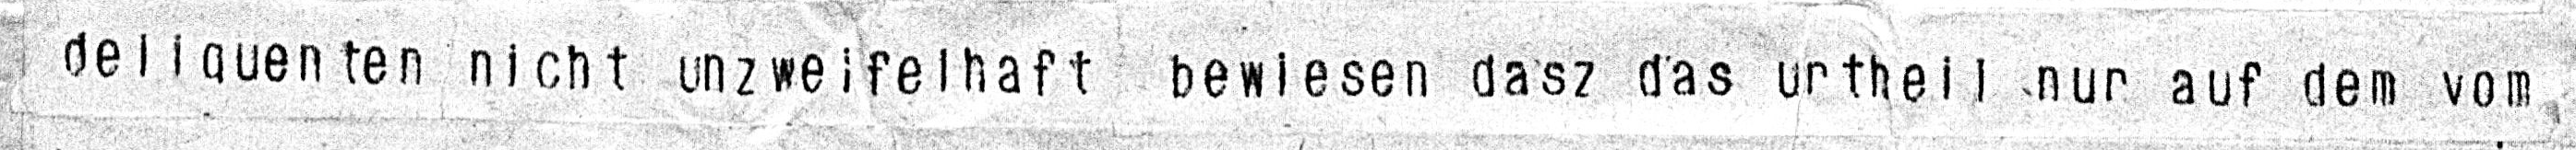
deliquenten nicht unzweifelhaft bewiesen dasz das urtheil nur auf dem vom
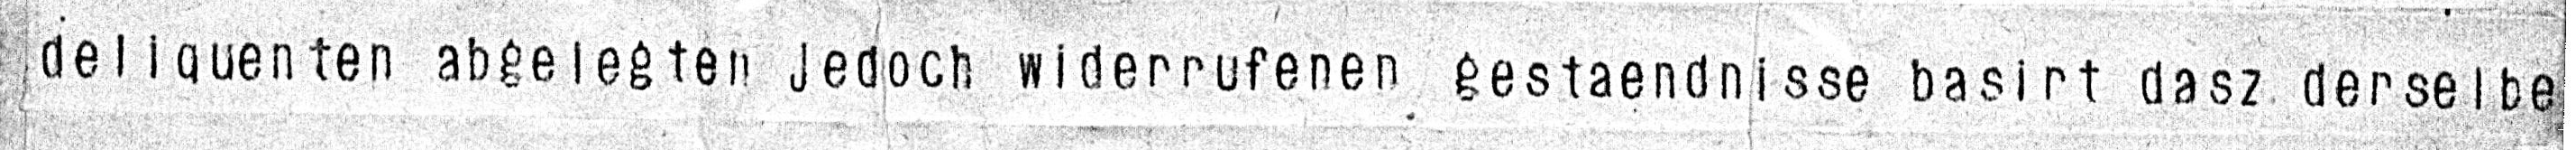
deliquenten abgelegten jedoch widerrufenen gestaendnisse basirt dasz derselbe
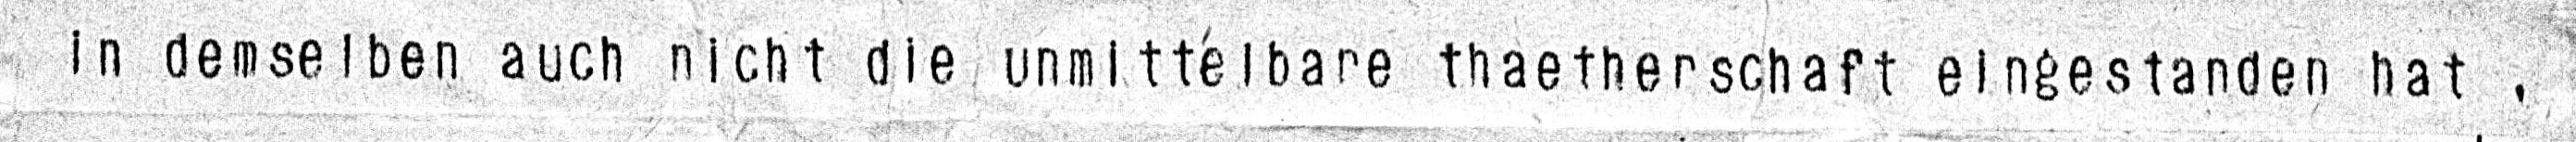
in demselben auch nicht die unittelbare thaetherschaft eingestanden hat.
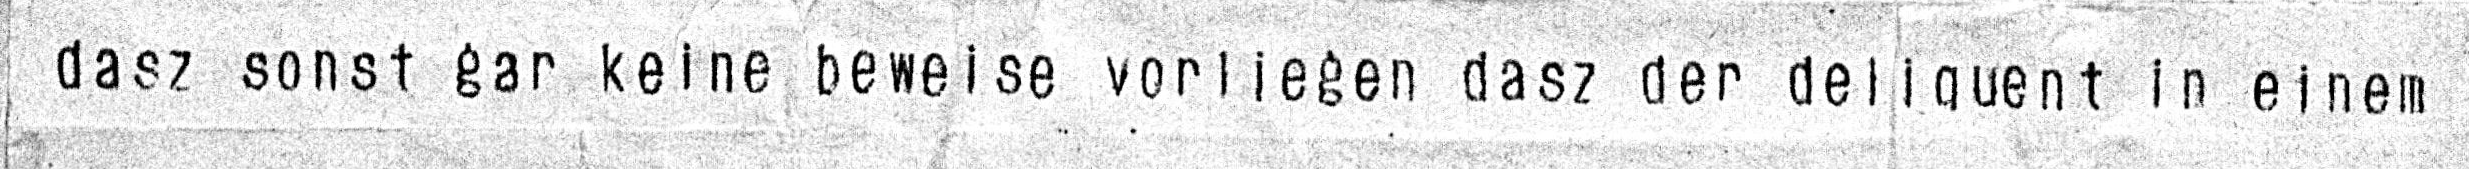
dasz sonst gar keine beweise vorliegen dasz der deliquent in einem
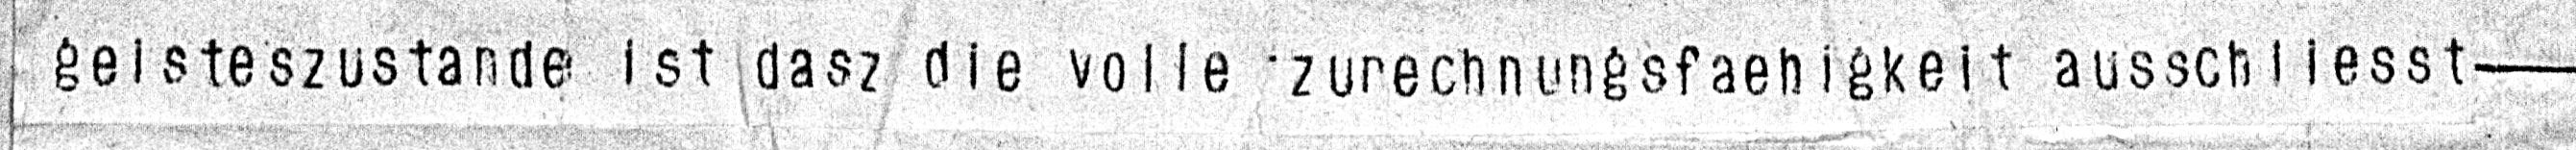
geisteszustande ist dasz die volle zurechnungsfaehigkeit ausschliesst
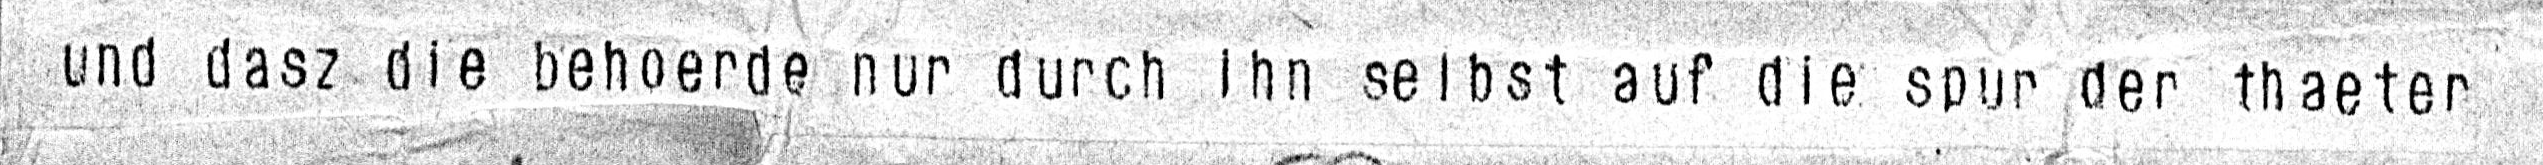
und dasz die behoerde nur durch ihn selbst auf die spur der thaeter
